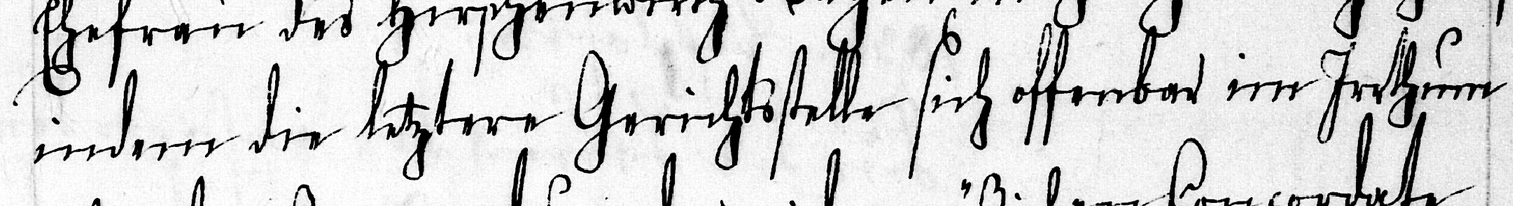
indem die letztere Gerichtsstelle sich offen¬
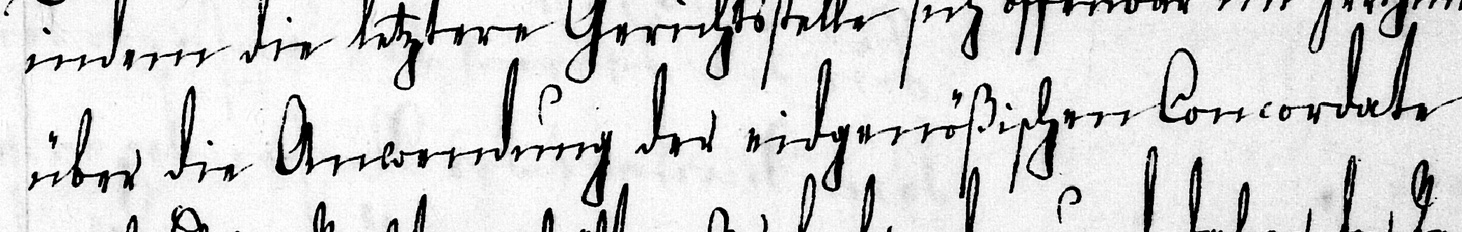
über die Anwendung der eidgenößischen Concordate
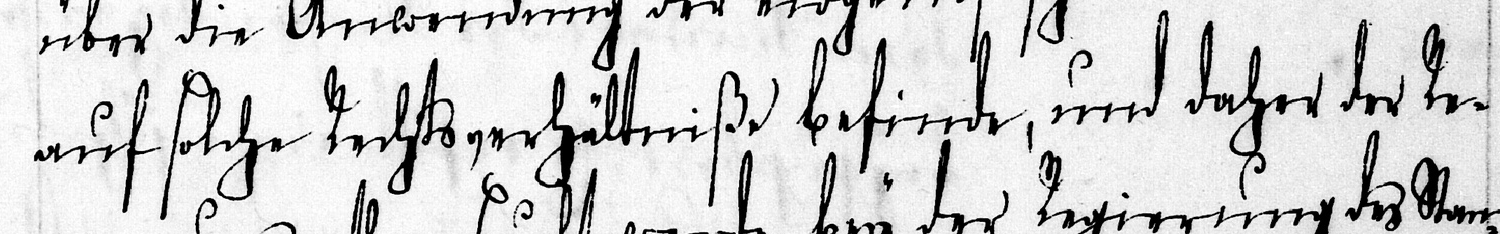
auf solche Rechtsverhältniße befinde, und daher der Re¬
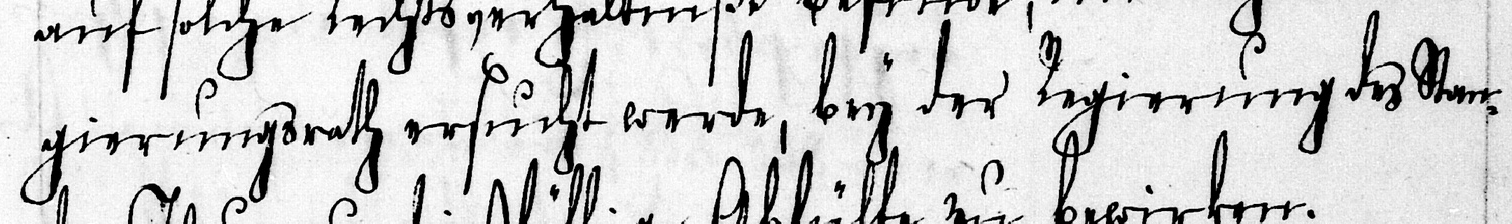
gierungsrath ersucht werde, bey der Regierung des Stan¬
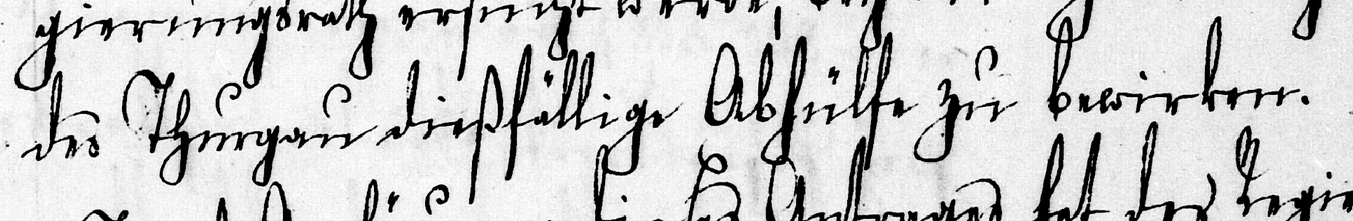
des Thurgau dießfällige Abhülfe zu bewirken.
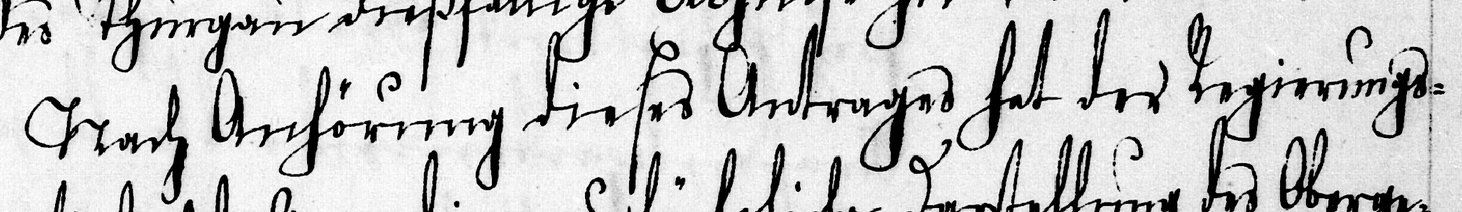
Nach Anhörung dieses Antrages hat der Regierungs¬
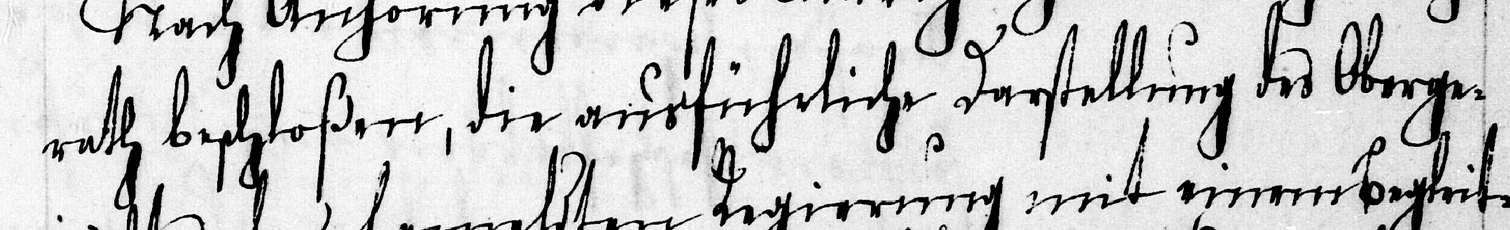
rath beschloßen, die ausführliche Darstellung des Oberg¬
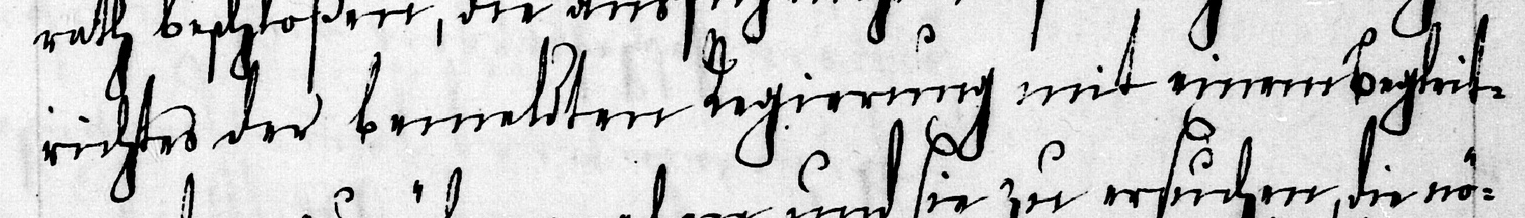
erichtes der bemeldten Regierung mit einem Begleit¬
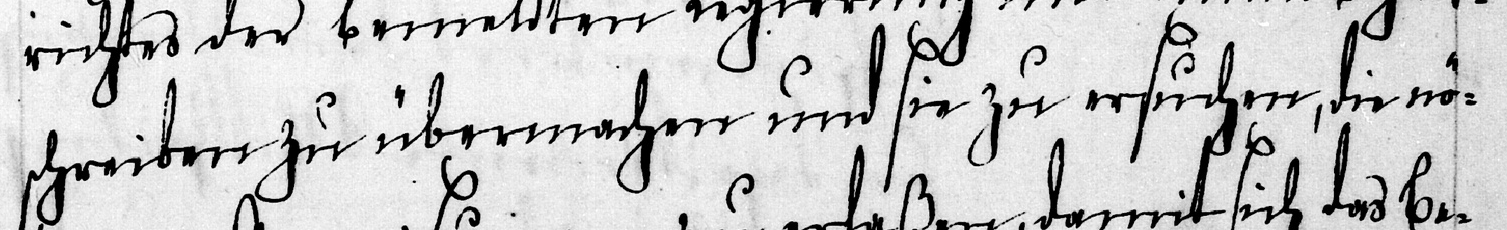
schreiben zu übermachen und sie zu ersuchen, die nö¬
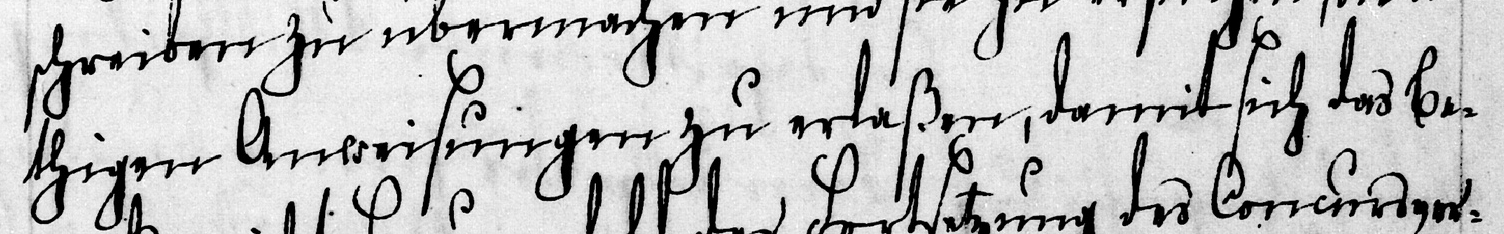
thigen Anweisungen zu erlaßen, damit sich das Be¬
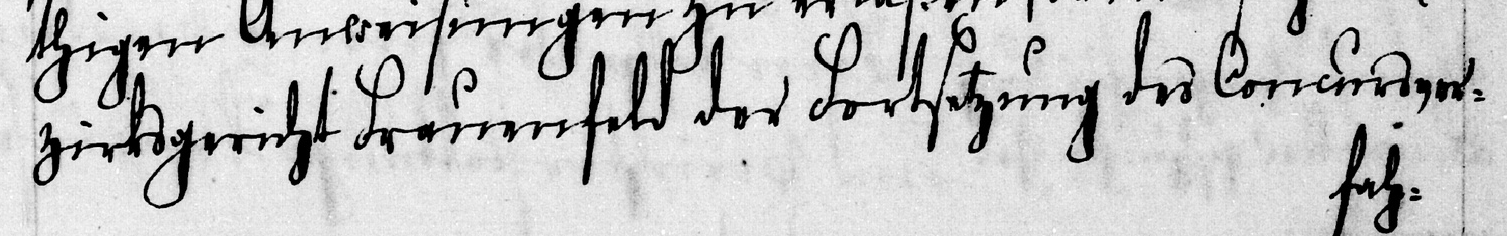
zirksgericht Frauenfeld der Fortsetzung des Concursver-
